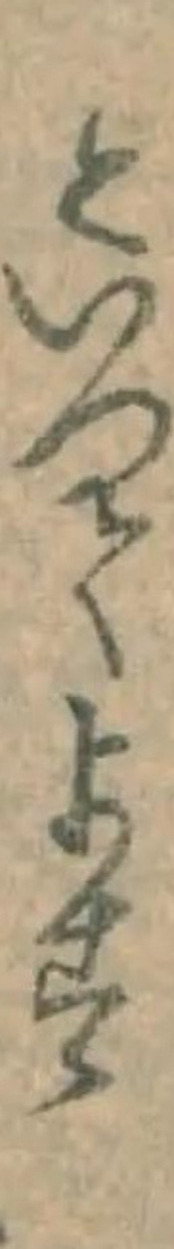といつてよす
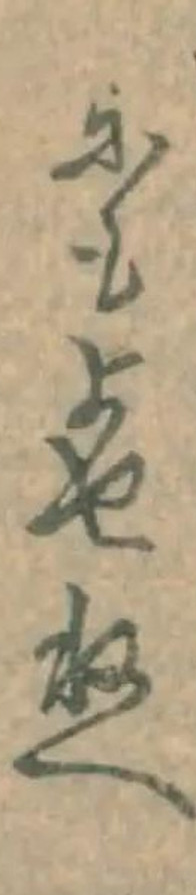にもよせねへ
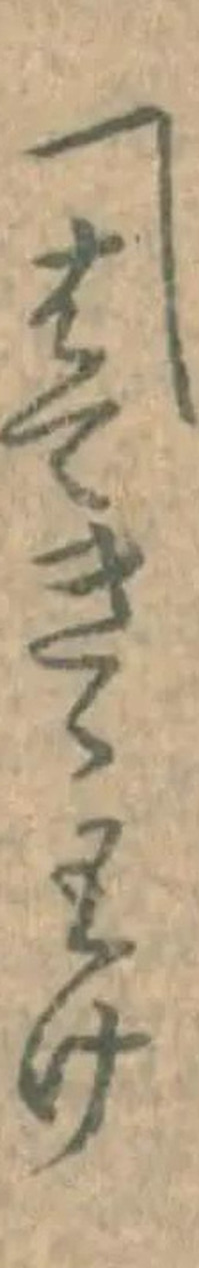〽はてきゝわけ
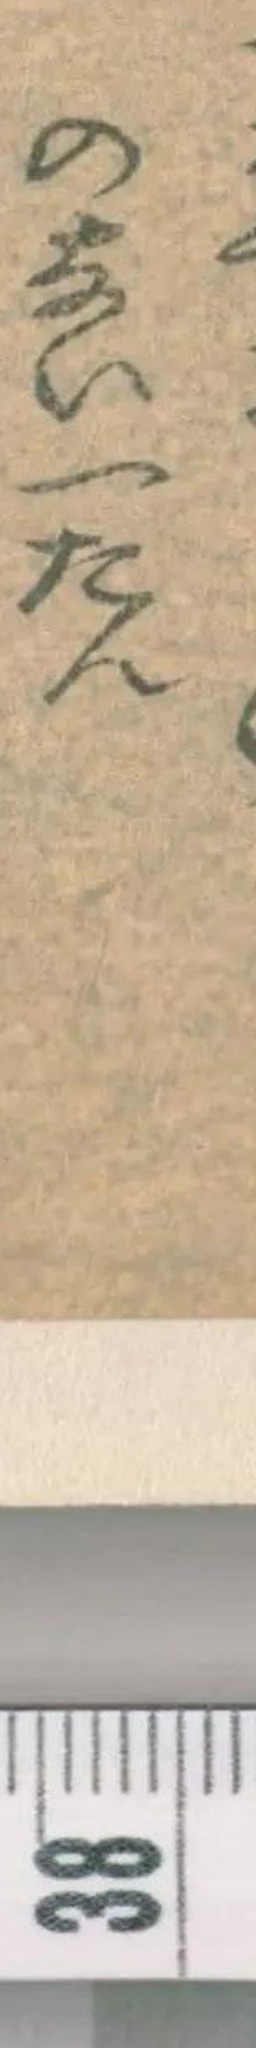のない一たん
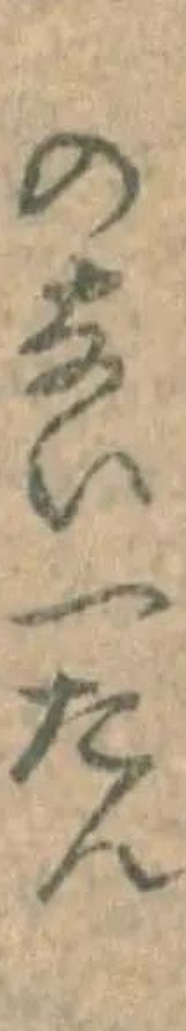のない一たん
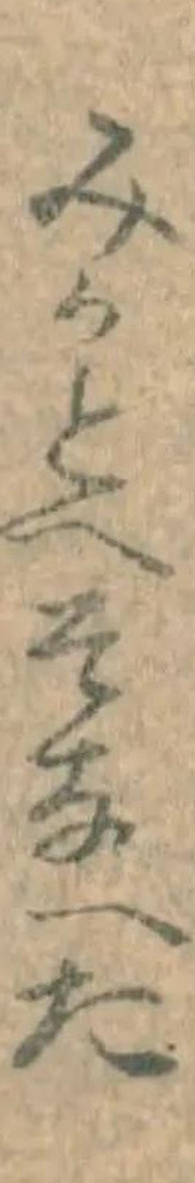みかとへそなへた
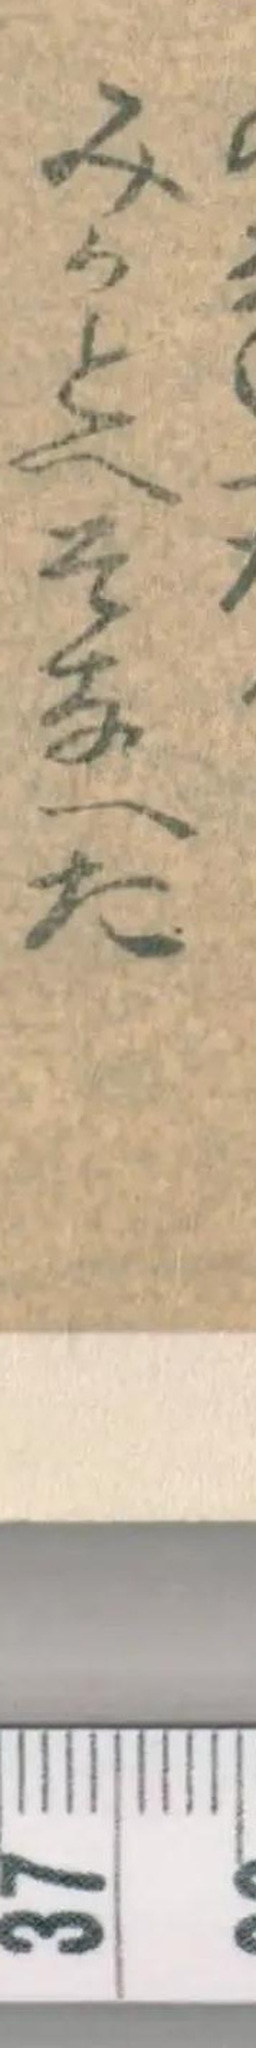みかとへそなへた
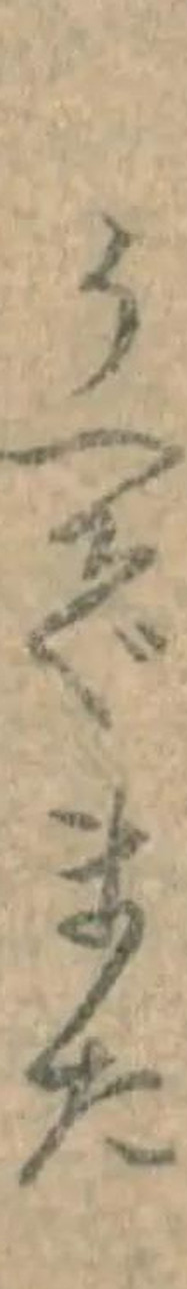うへでまた
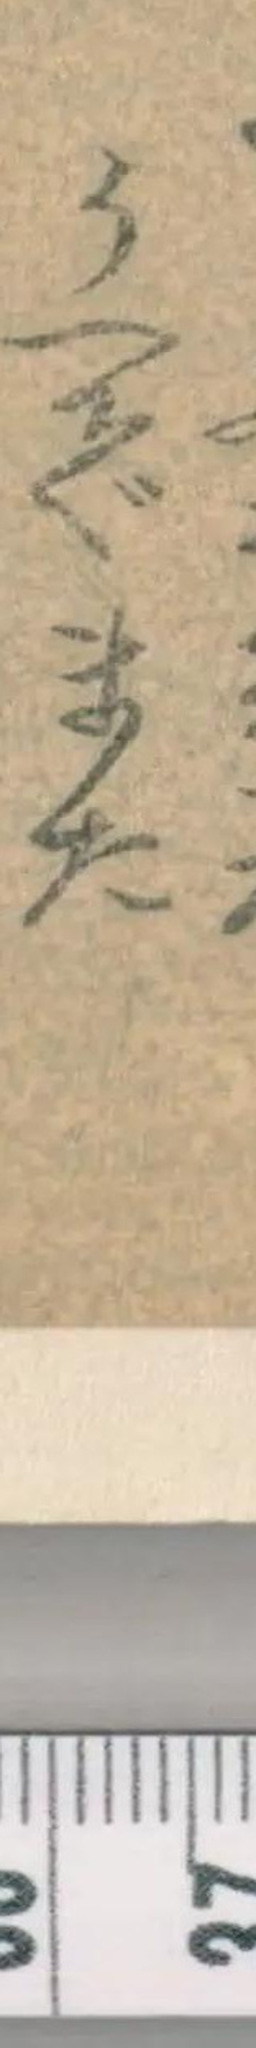うへでまた
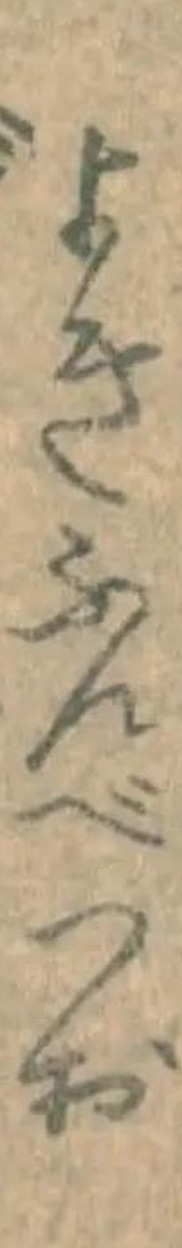よきふんべつお
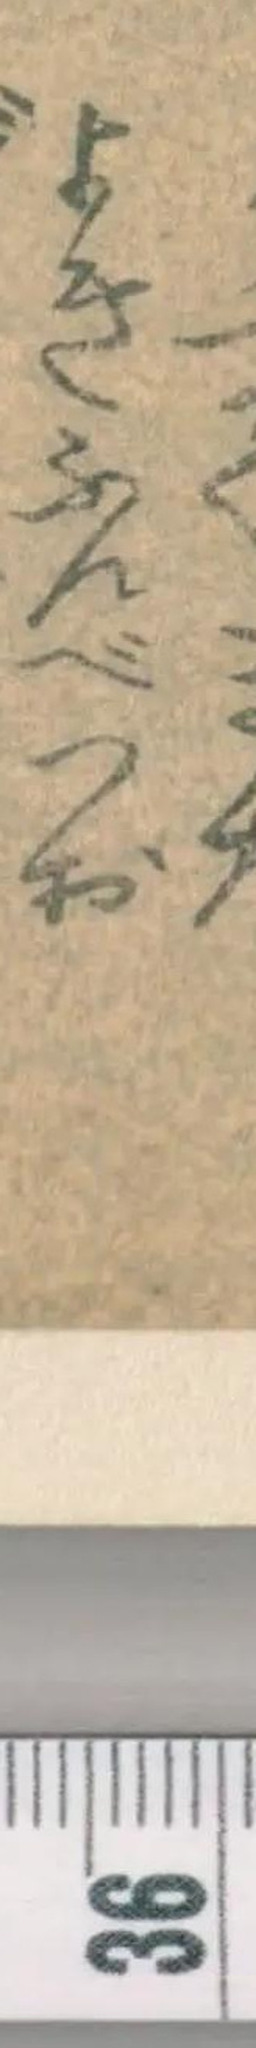よきふんべつお
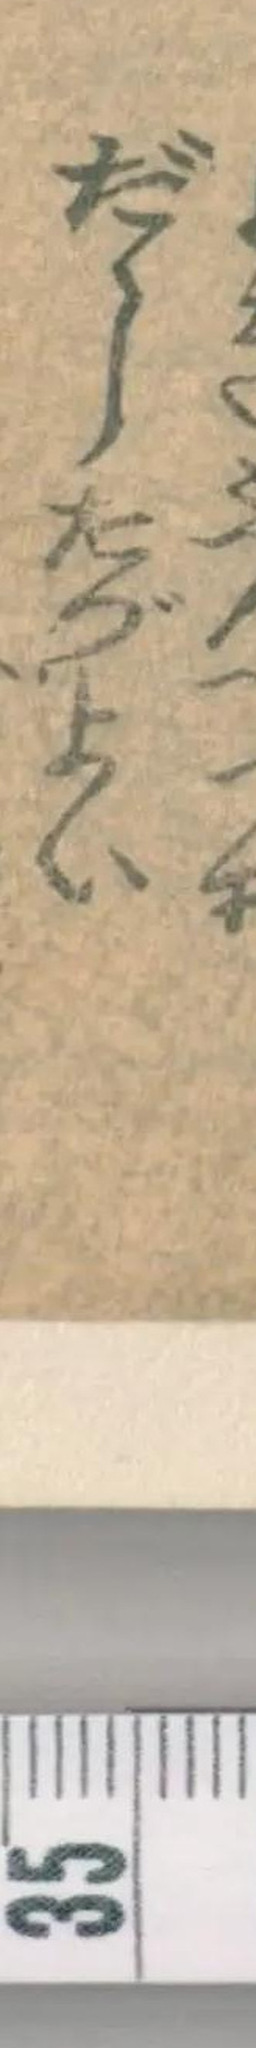だしたがよい
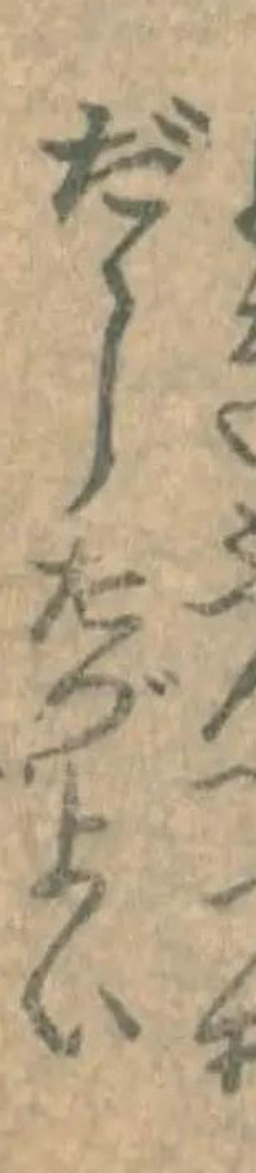だしたがよい

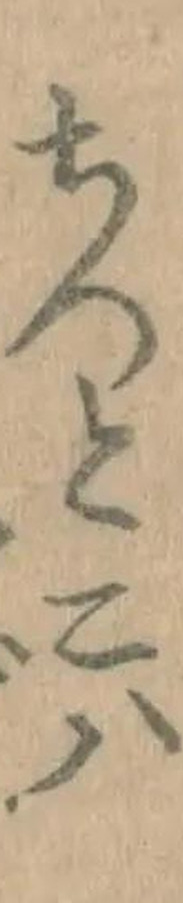ちつとこは
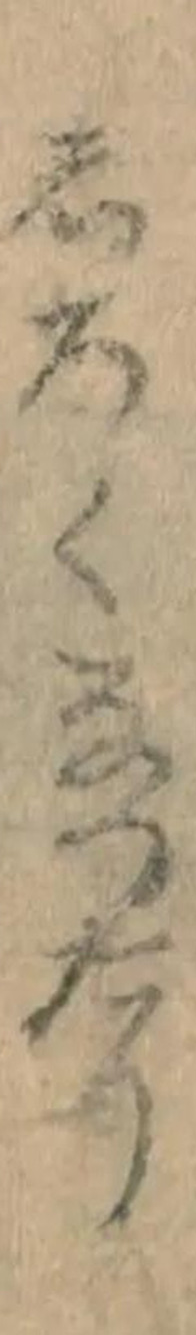しろくなつたり
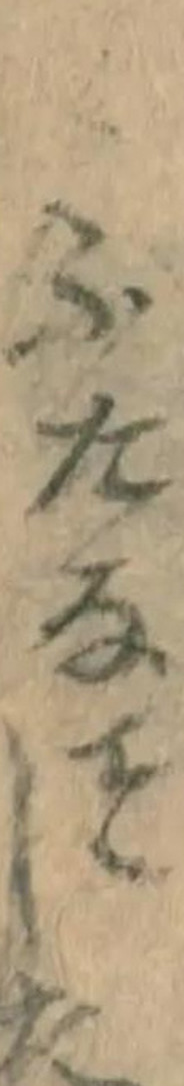ふたなを
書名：国芳国貞錦絵
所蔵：国立国会図書館 National Diet Library, JAPAN
